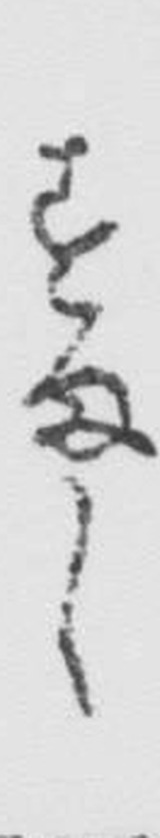すまし
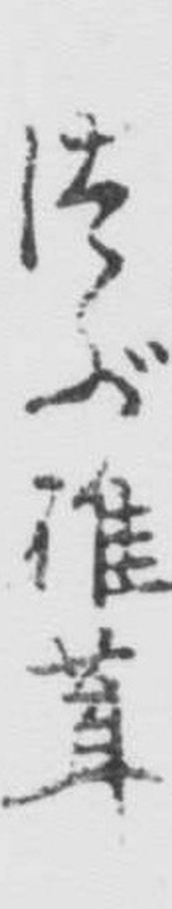つぶ椎茸
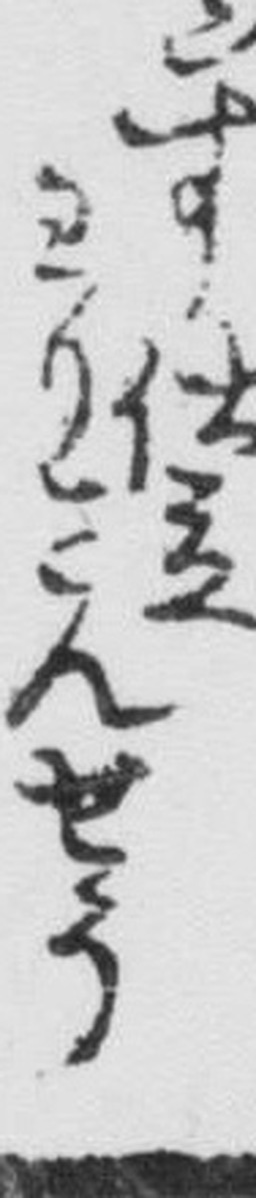わりさんせう
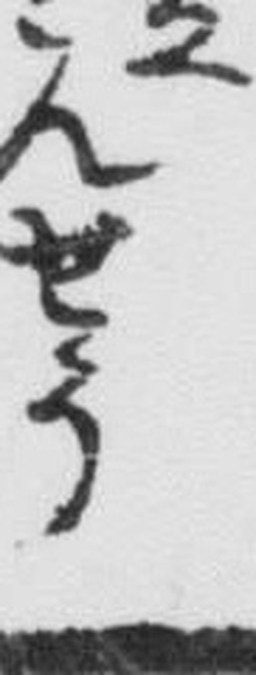こせう
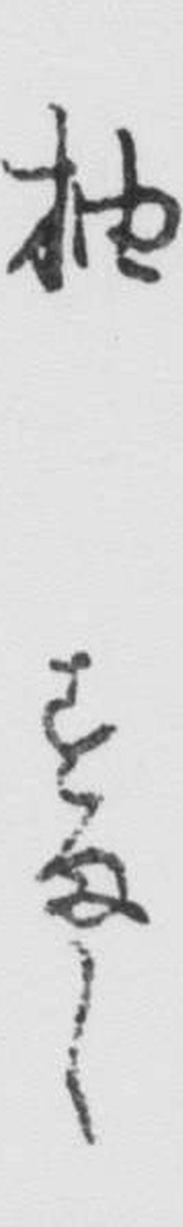柚すまし
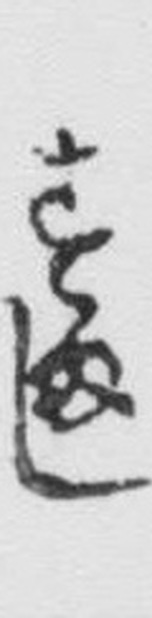すまし
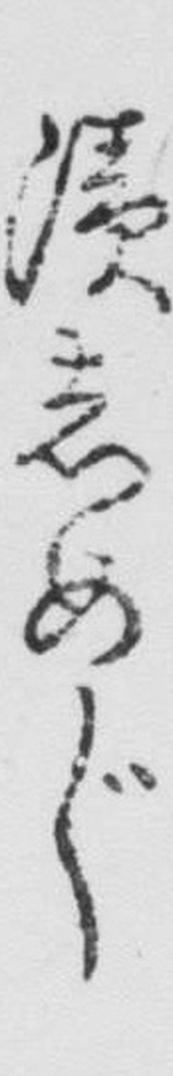漬しめじ
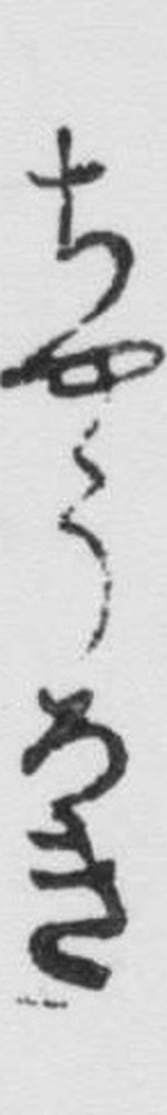ちやうろき
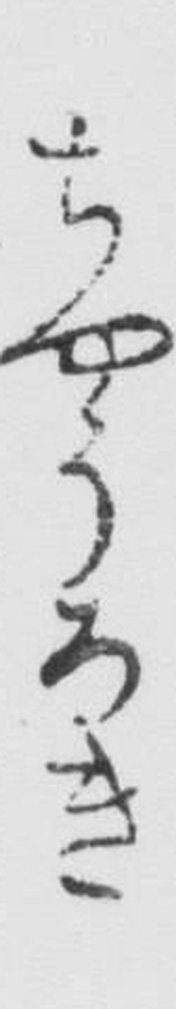ちやうろき
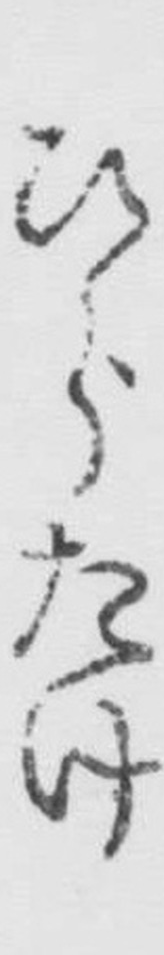ひらたけ
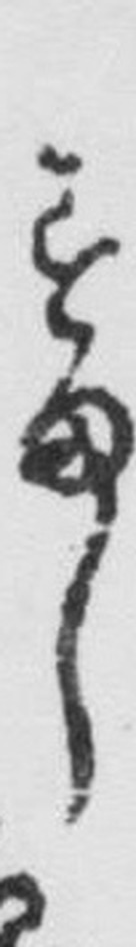すまし
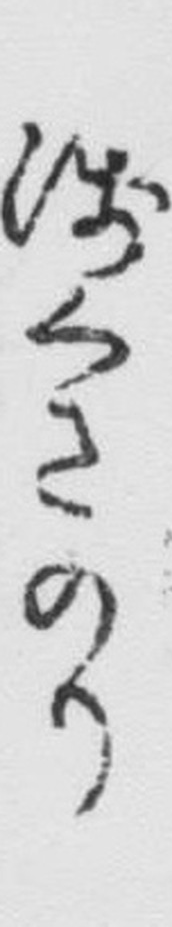浅くさのり
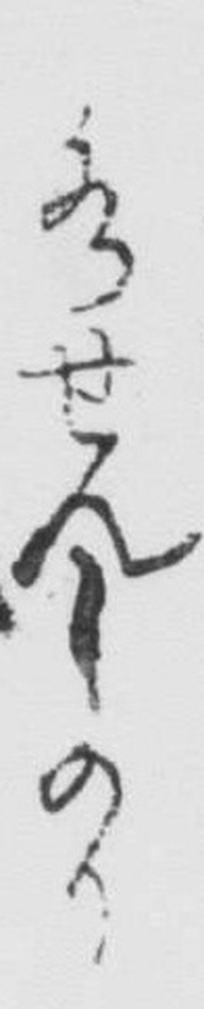水せんしのり
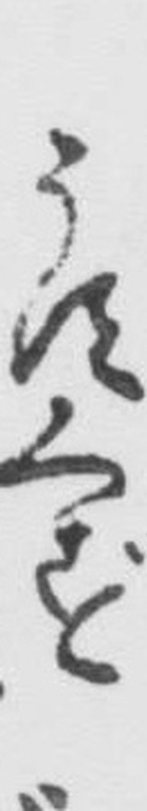うすくず
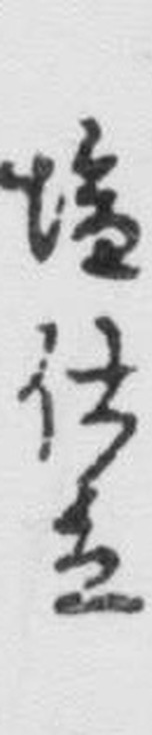塩仕立
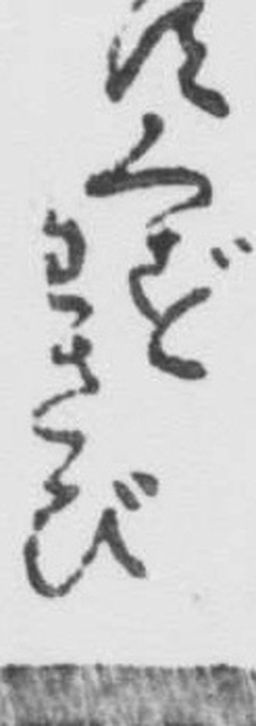わさび
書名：諸家通用/即席料理
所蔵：大阪府立大学学術情報センター 国文学研究資料館
